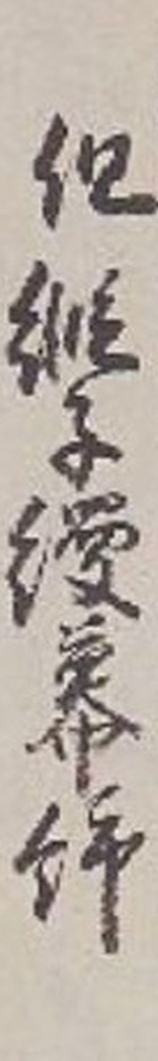但緞子縵幕飾

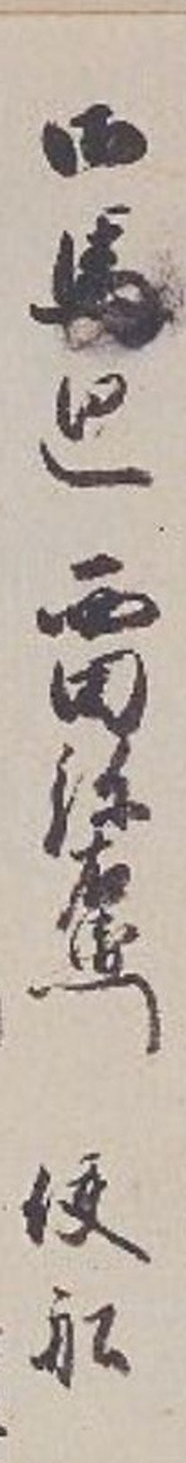御馬廻西田弥右衛門使船
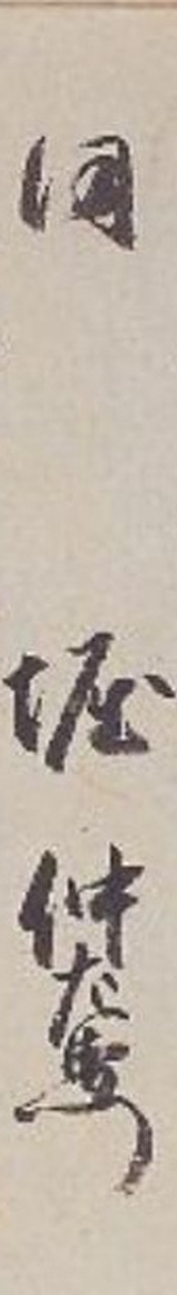同堀仲左衛門
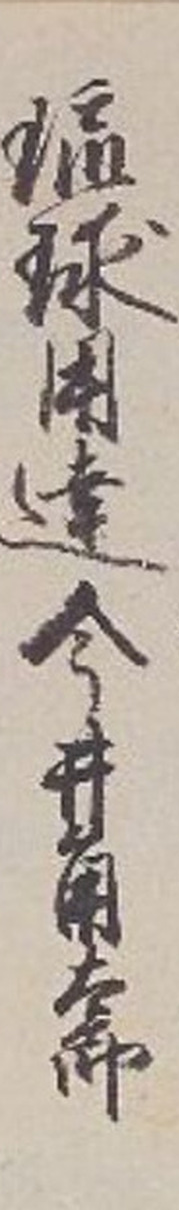琉球用達今井角太郎
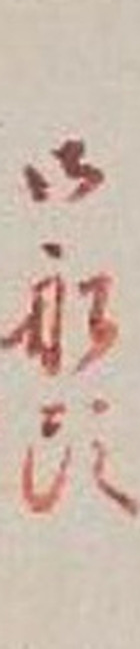御船頭
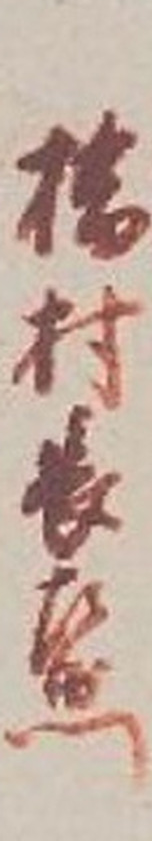橋村長左衛門

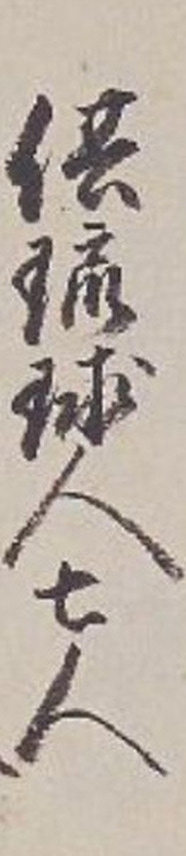供琉球人七人
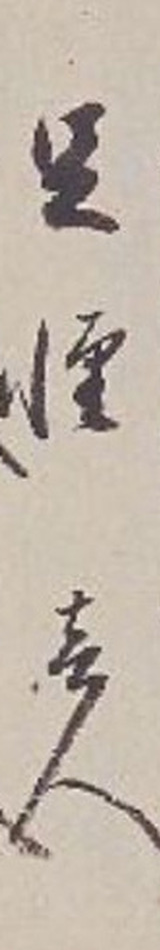足軽壱人
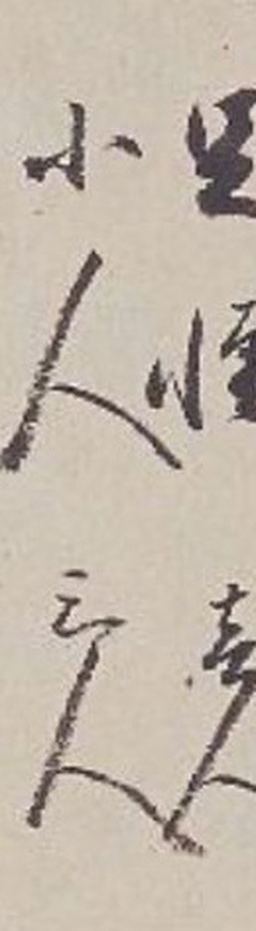小人三人
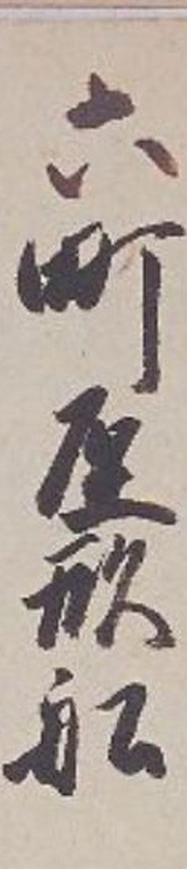六町屋形船
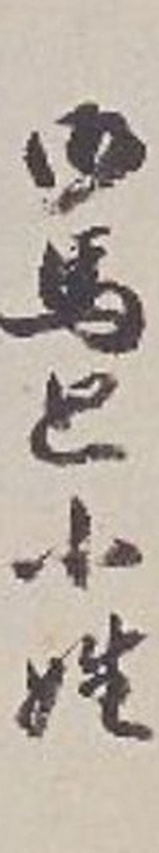御馬廻小姓
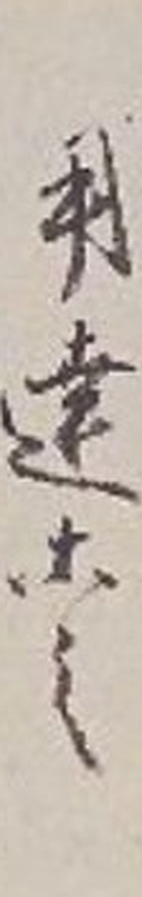用達等之
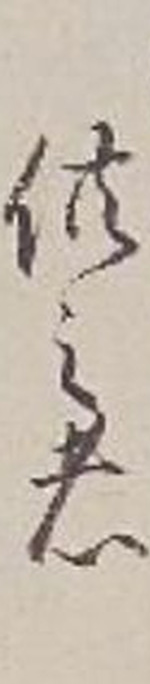供之者

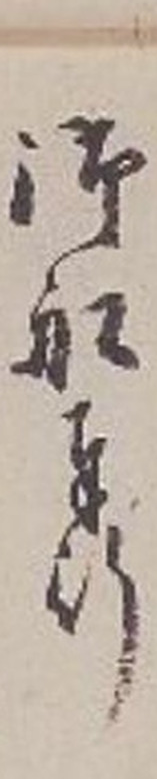御船奉行
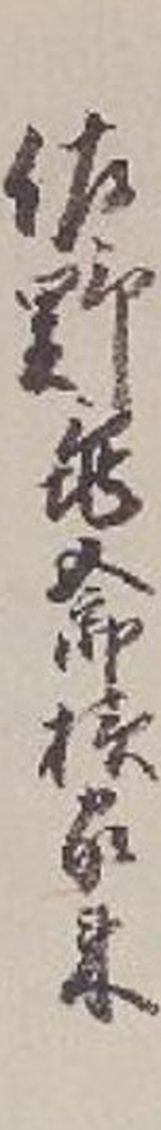佐野亀五郎様家来
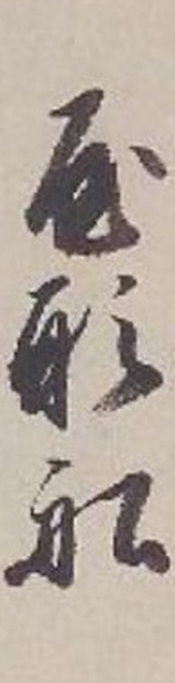屋形船
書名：琉球人就来府淀川筋船行列帳 但木津川より大阪御屋敷迄並其外一巻
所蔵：University of the Ryukyus Library
